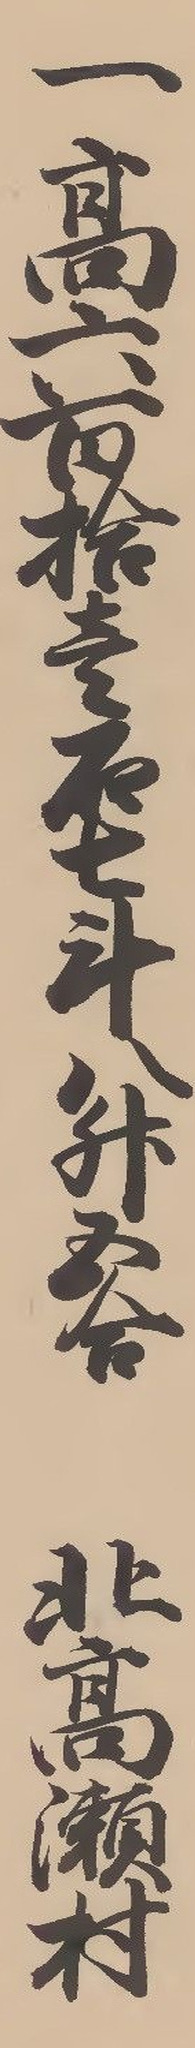一高六百拾壱石七斗八升五合北高瀬村
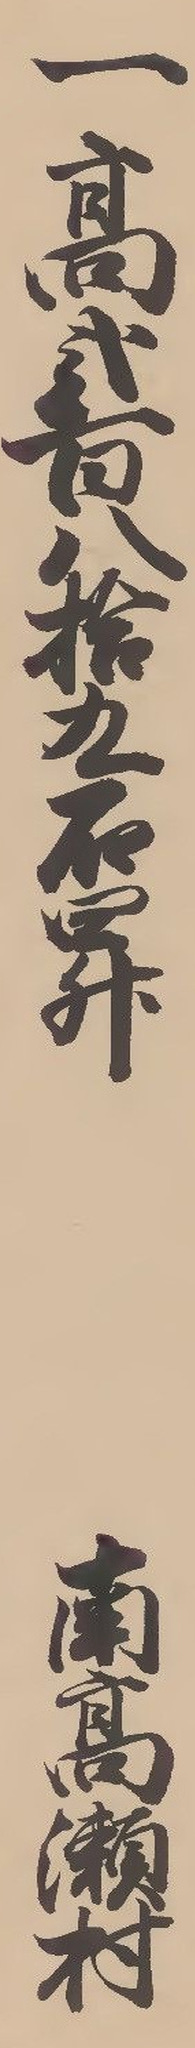一高弐百八拾九石四升南高瀬村
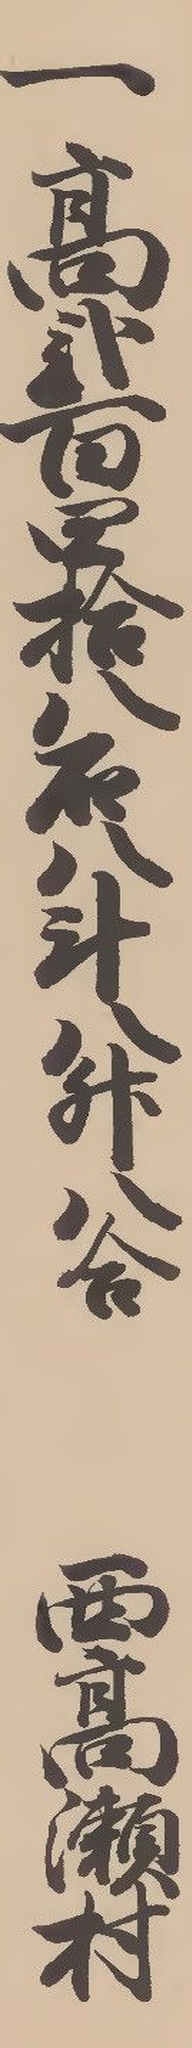一高弐百四拾八石八斗八升八合西高瀬村
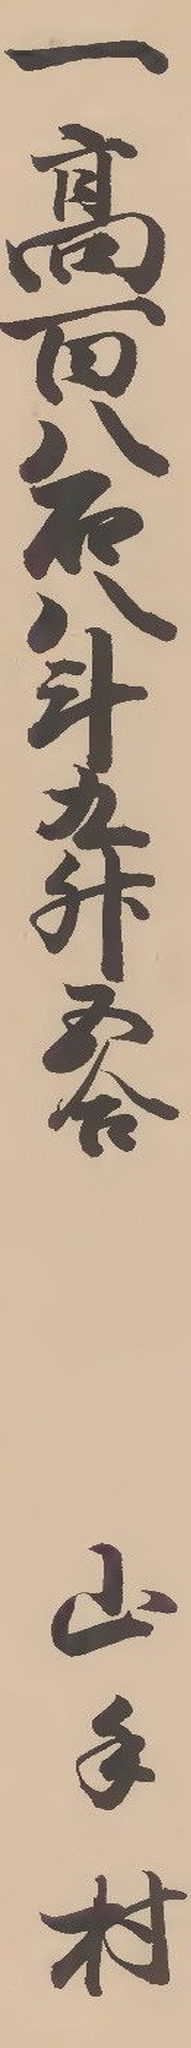一高百八石八斗九升五合山手村

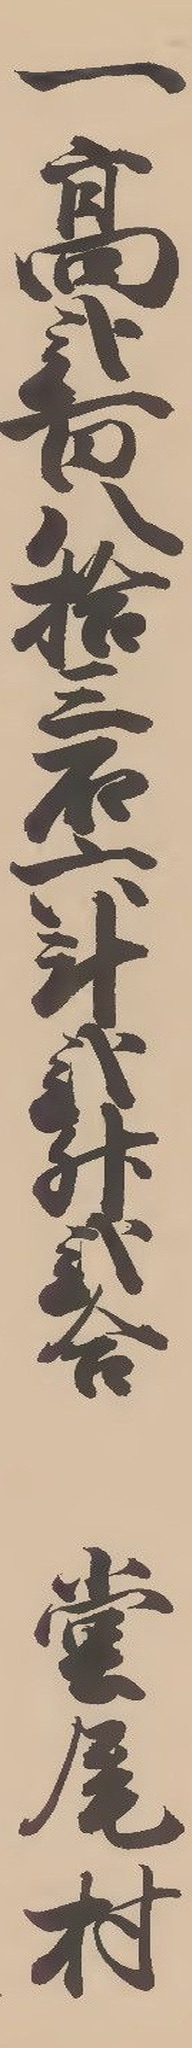一高弐百八拾三石六斗弐升弐合堂尾村
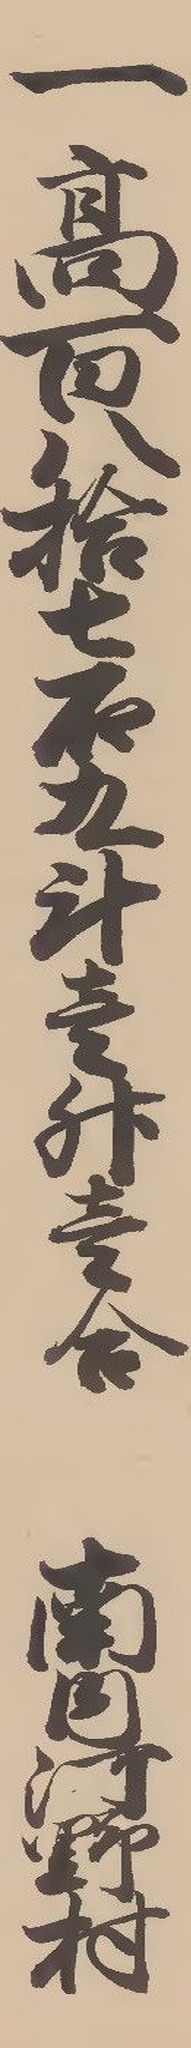一高百八拾七石九斗壱升壱合南内河野村
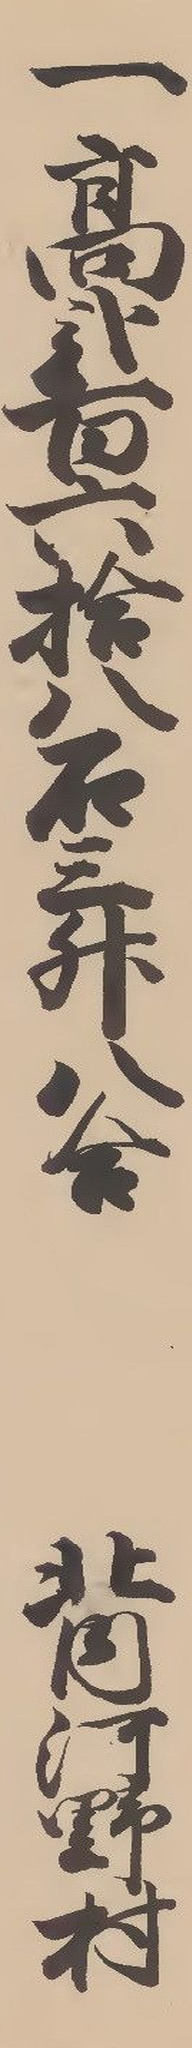一高弐百六拾八石三升八合北内河野村
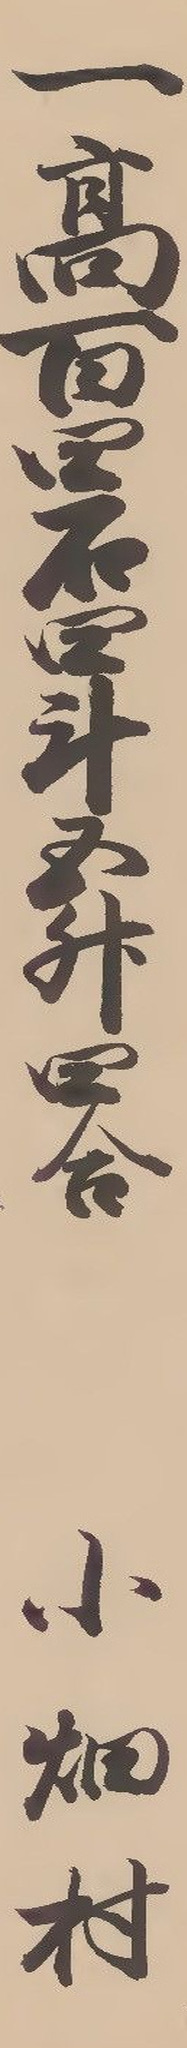一高百四石四斗五升四合小畑村
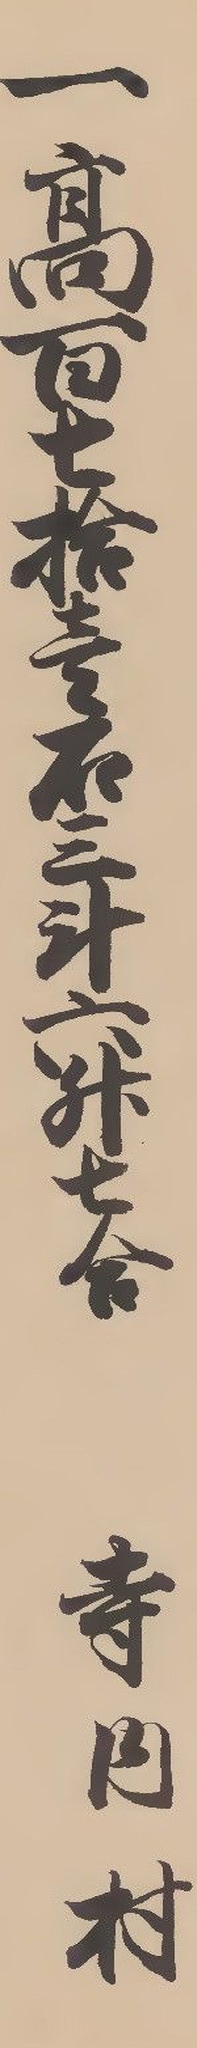一高百七拾壱石三斗六升七合寺内村
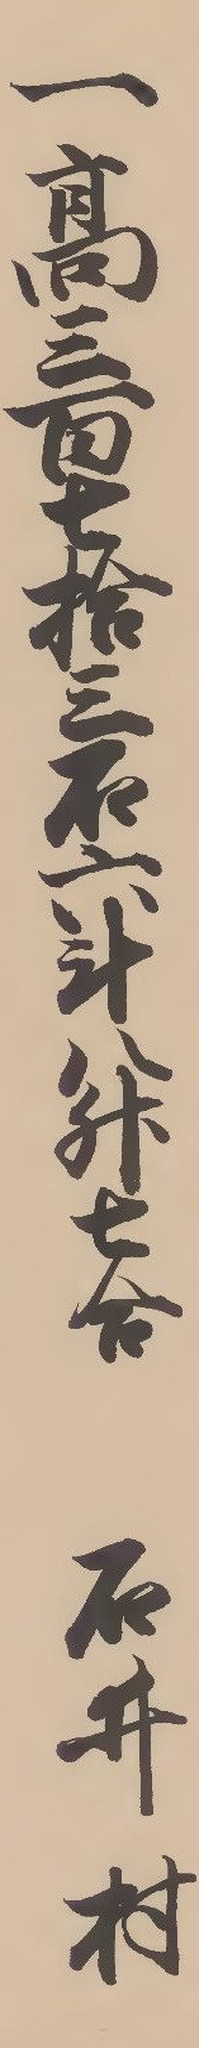一高三百七拾三石六斗八升七合石井村
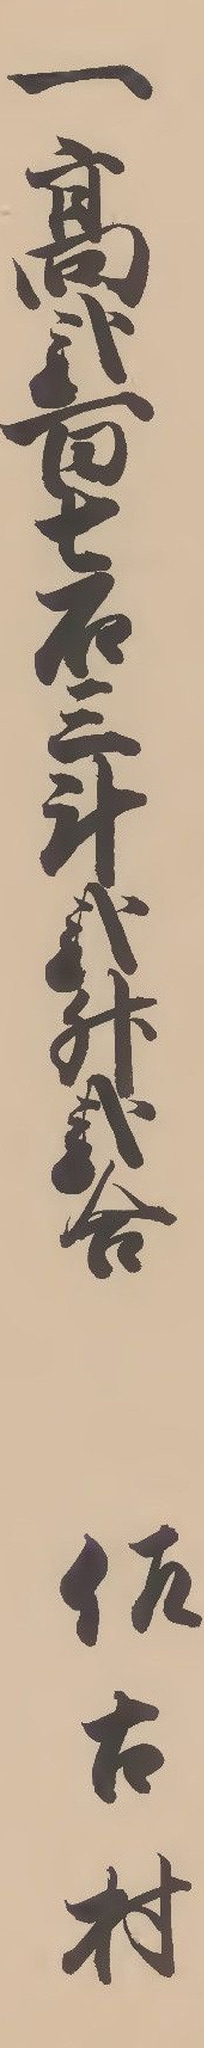一高弐百七石三斗弐升弐合佐古村
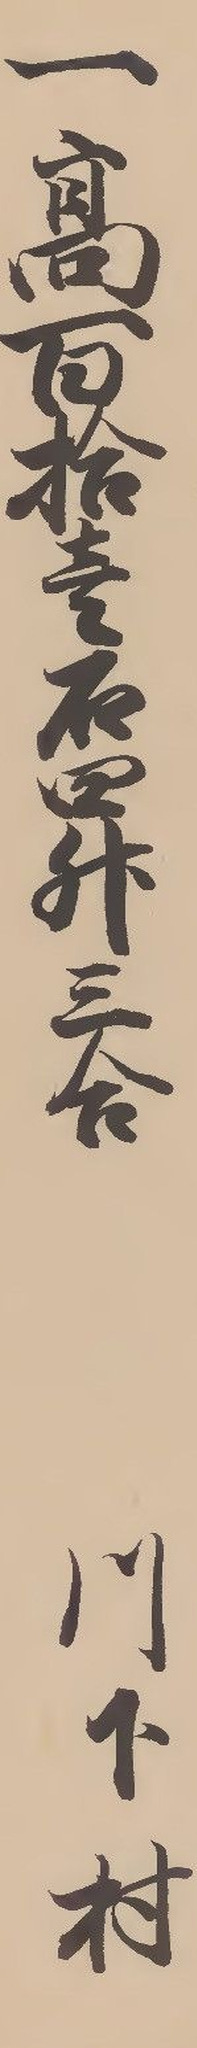一高百拾壱石四升三合川下村

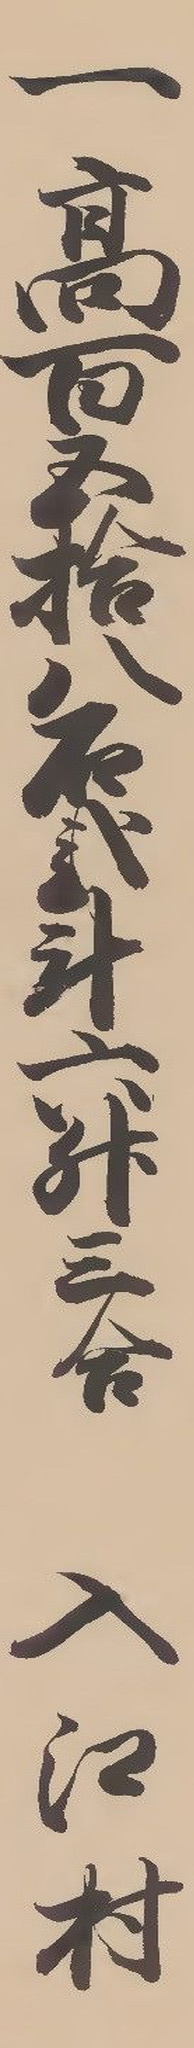一高百五拾八石弐斗六升三合入江村
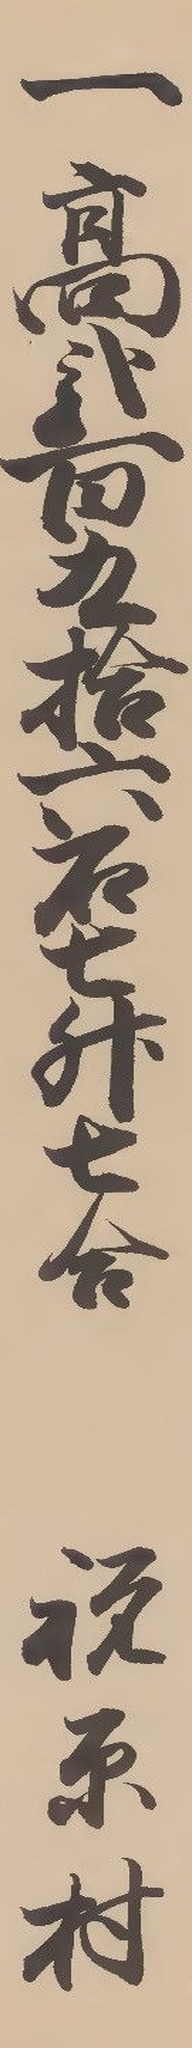一高弐百九拾六石七升七合祝原村
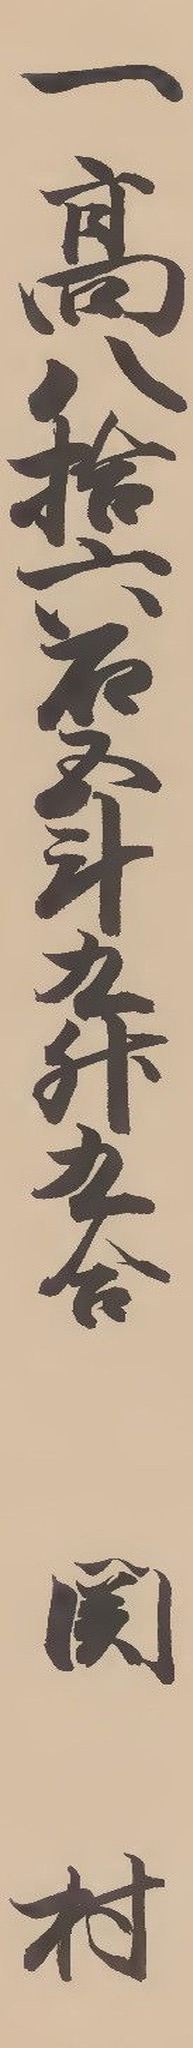一高八拾六石五斗九升九合関村
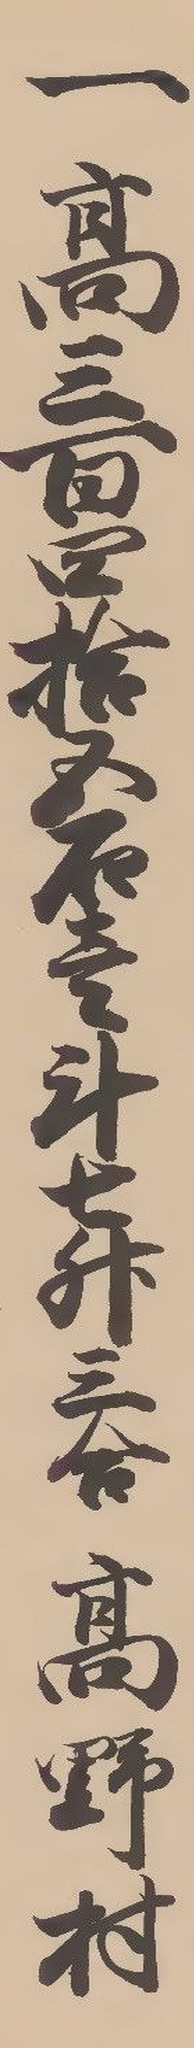一高三百四拾五石壱斗七升三合高野村
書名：豊後国郷帳
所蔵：国立公文書館 National Archives of Japan
